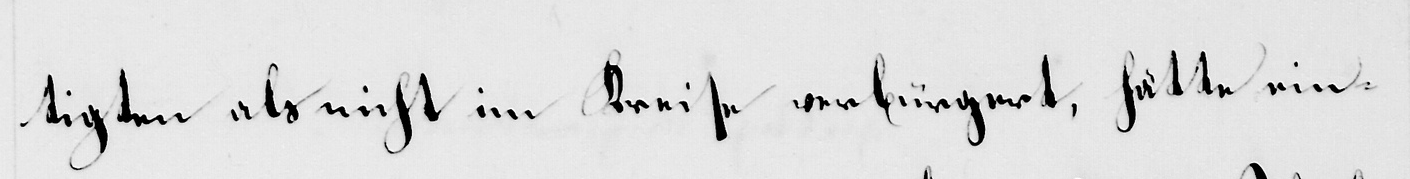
tigten als nicht im Kreise verbürgert, hätte ein¬
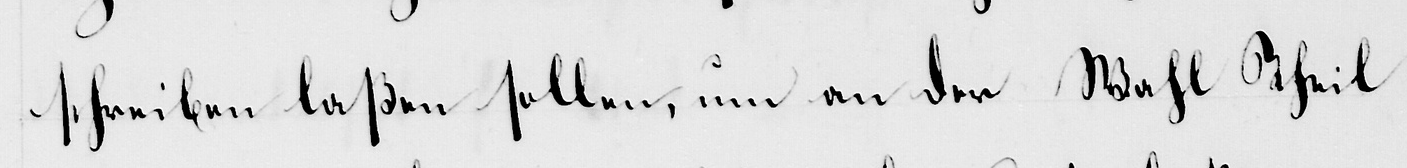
schreiben laßen sollen, um an der Wahl Theil
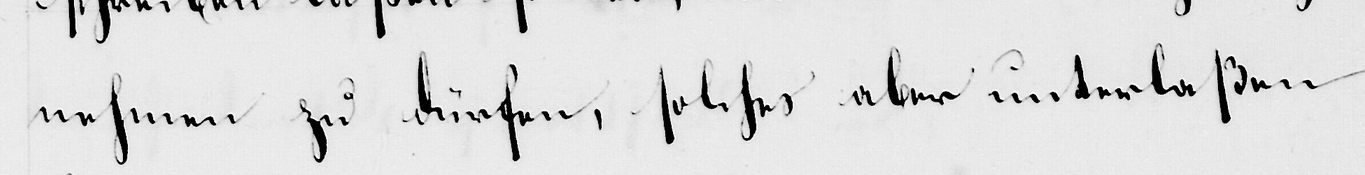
nehmen zu dürfen, solches aber unterlaßen
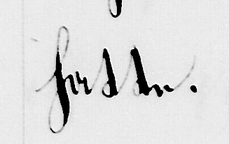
hatte.
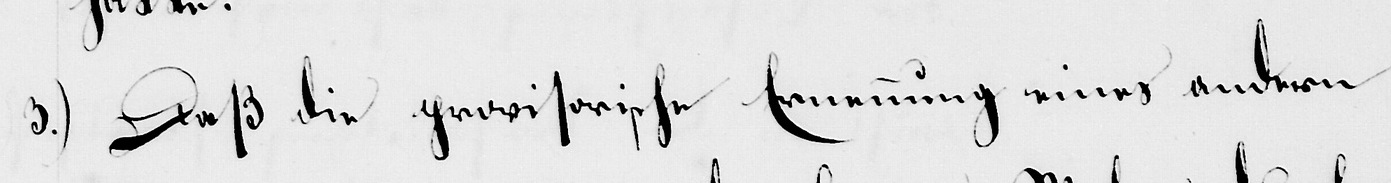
3.) Daß die provisorische Ernennung eines andern
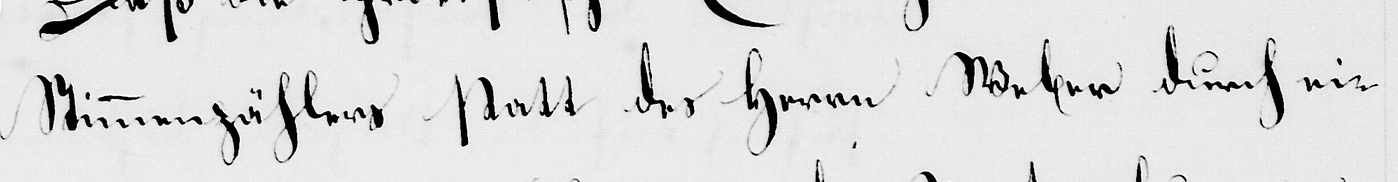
Stimmenzählers statt des Herrn Weber durch ei¬
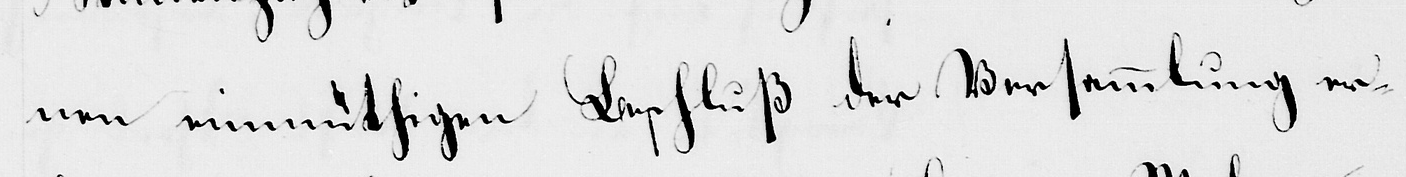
nen einmüthigen Beschluß der Versammlung er¬
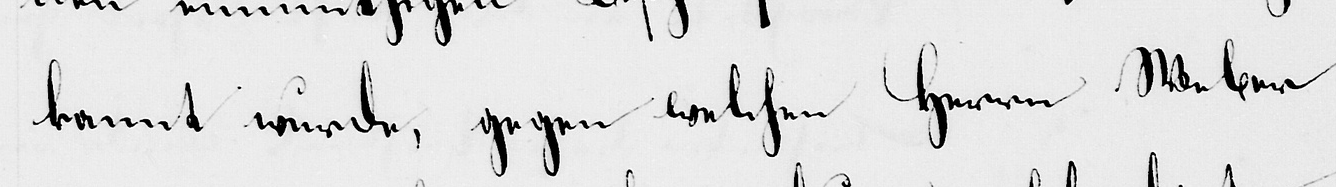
kannt wurde, gegen welchen Herrn Weber
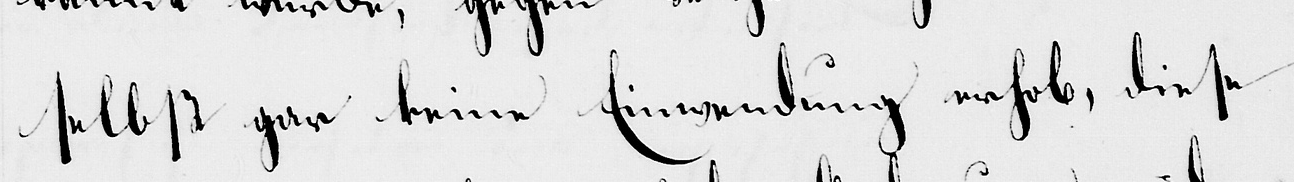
selbst gar keine Einwendung erhob, diese
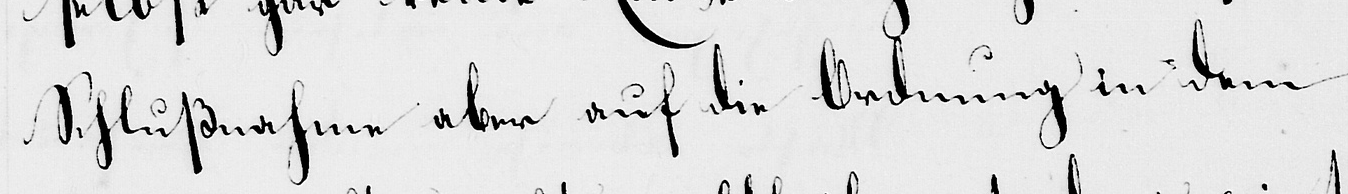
Schlußnahme aber auf die Ordnung in dem
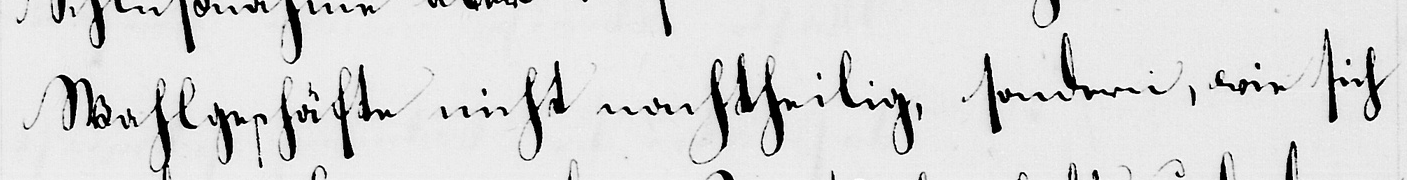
Wahlgeschäfte nicht nachtheilig, sondern, wie sich
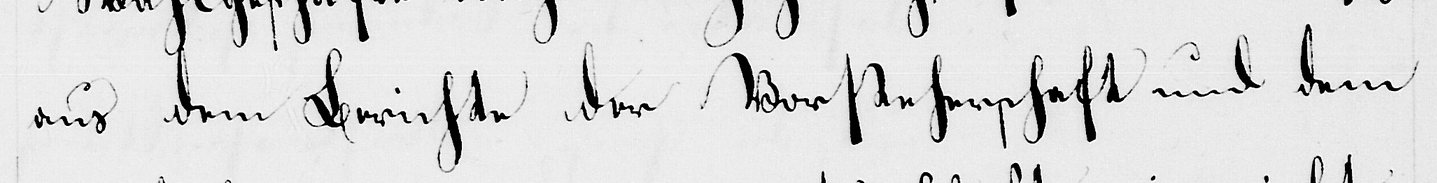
aus dem Berichte der Vorsteherschaft und dem
